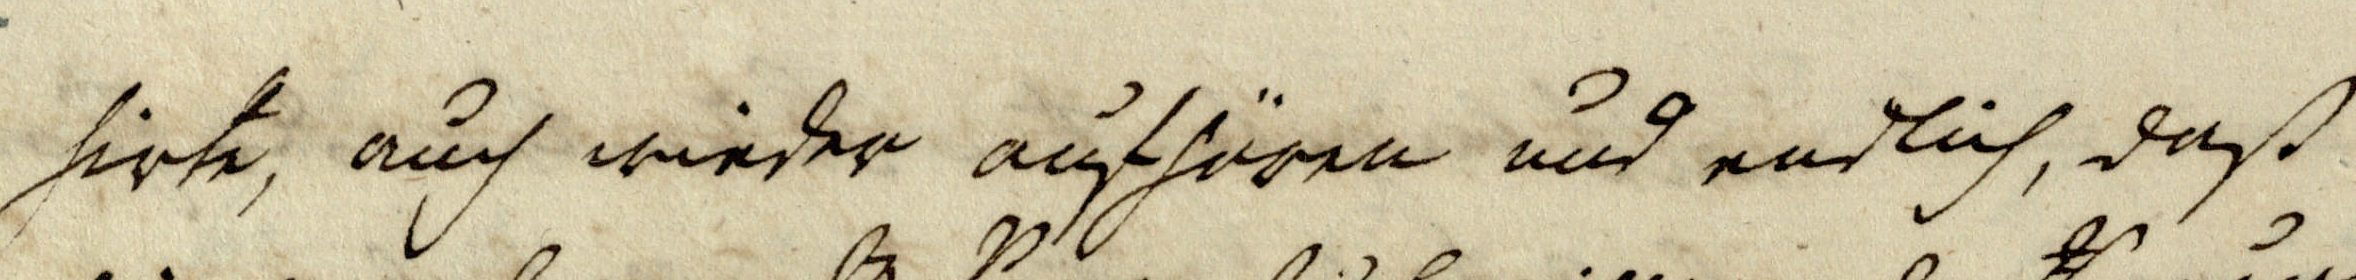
sirte, auch wieder aufhören und endlich, daß
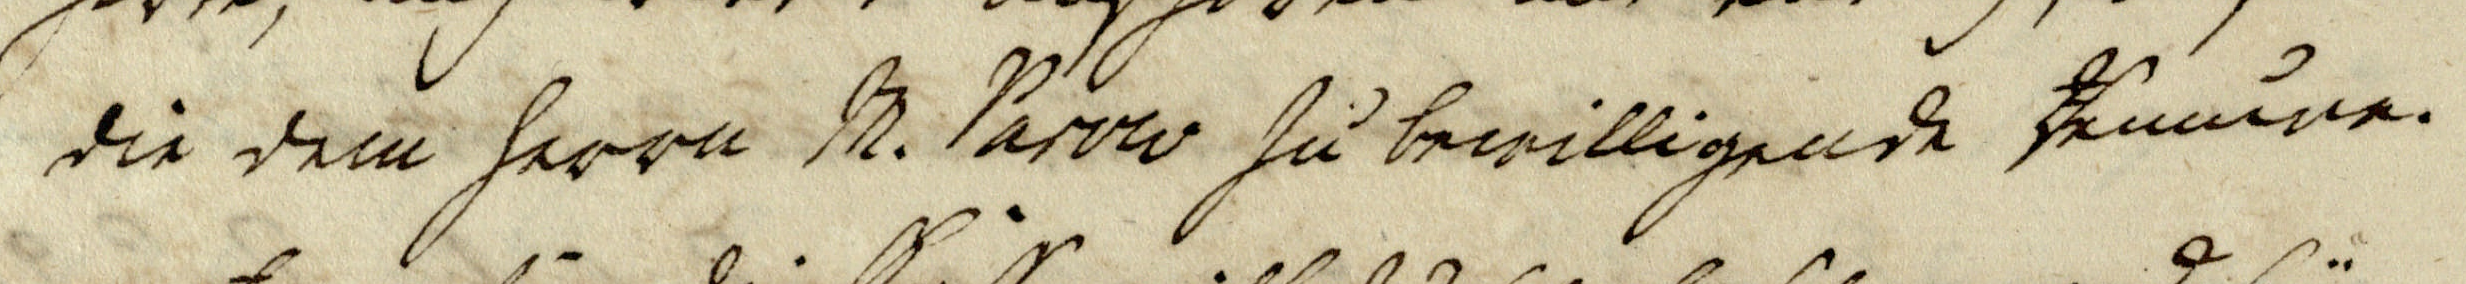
die dem Herrn M. Parow zu bewilligende Remune¬
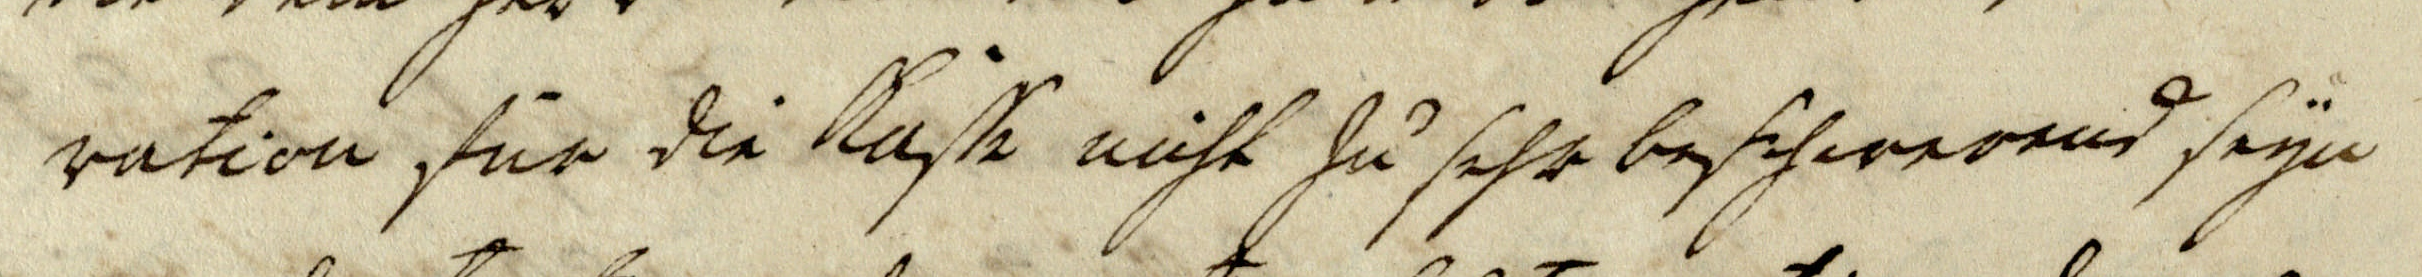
ration für die Kasse nicht zu sehr beschwerend seÿn
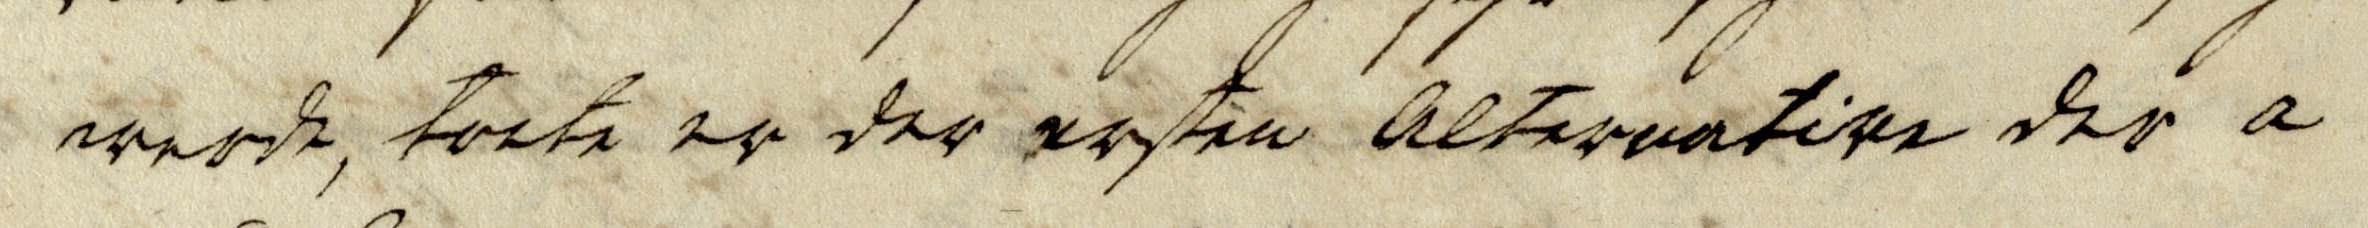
werde, trete er der ersten Alternative der a
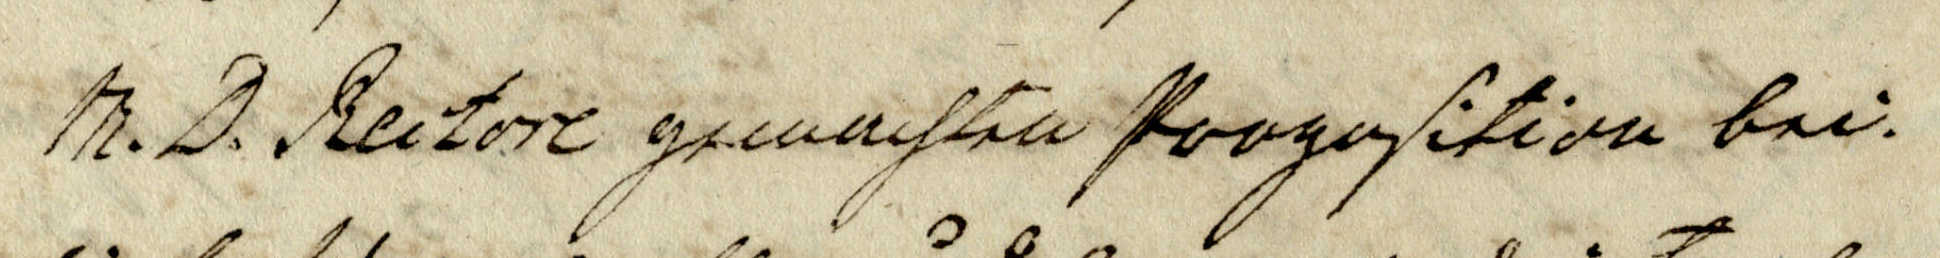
M. D. Rectore gemachten Proposition bei.
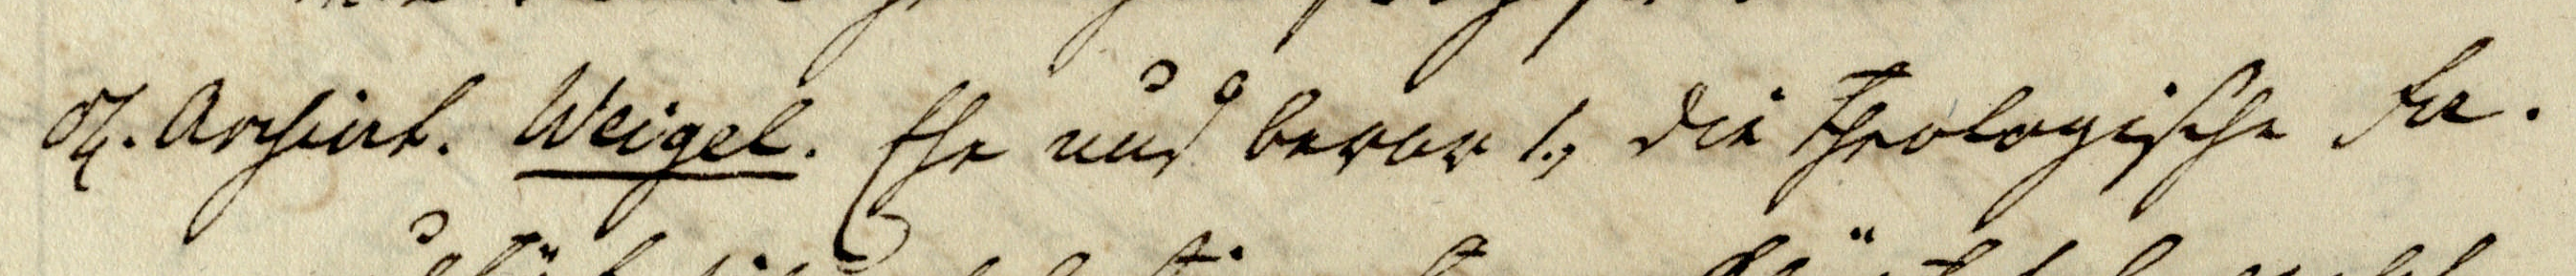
dh. Archiat. Weigel. Ehe und bevor 1., die Theologische Fa¬
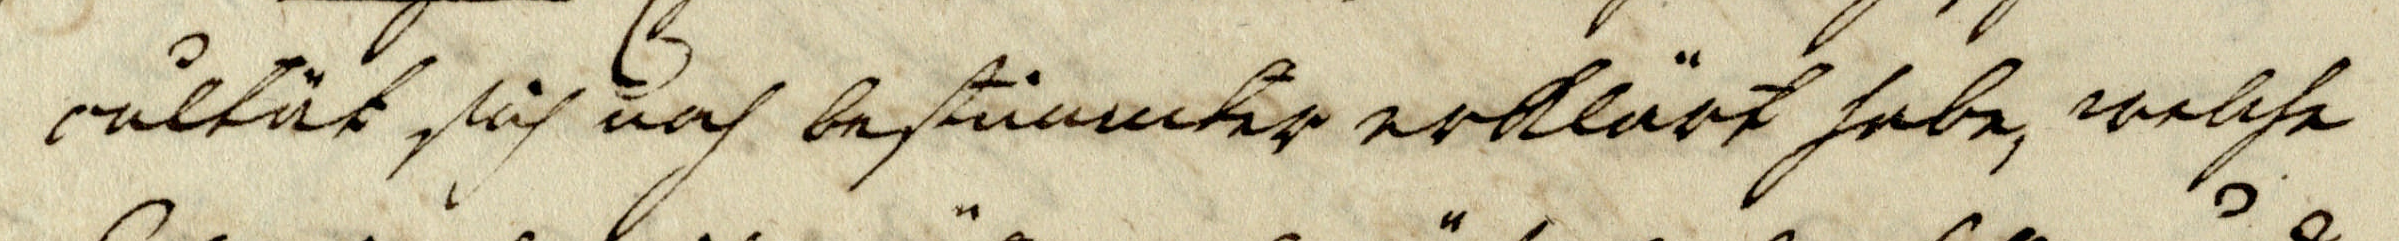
cultät sich noch bestimmter erklärt habe, welche
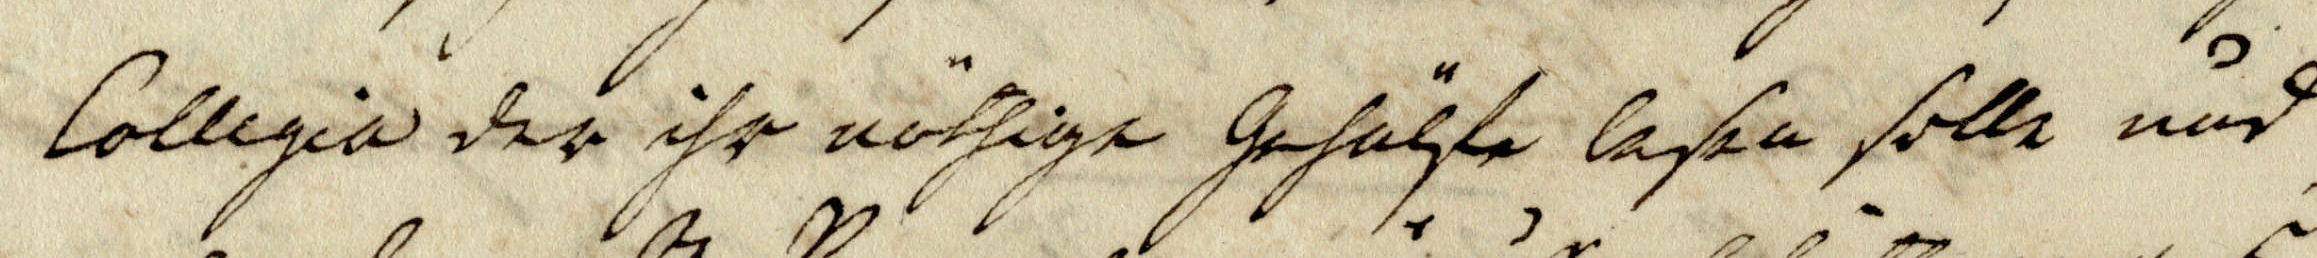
Collegia der ihr nöthige Gehülfe lesen solle und
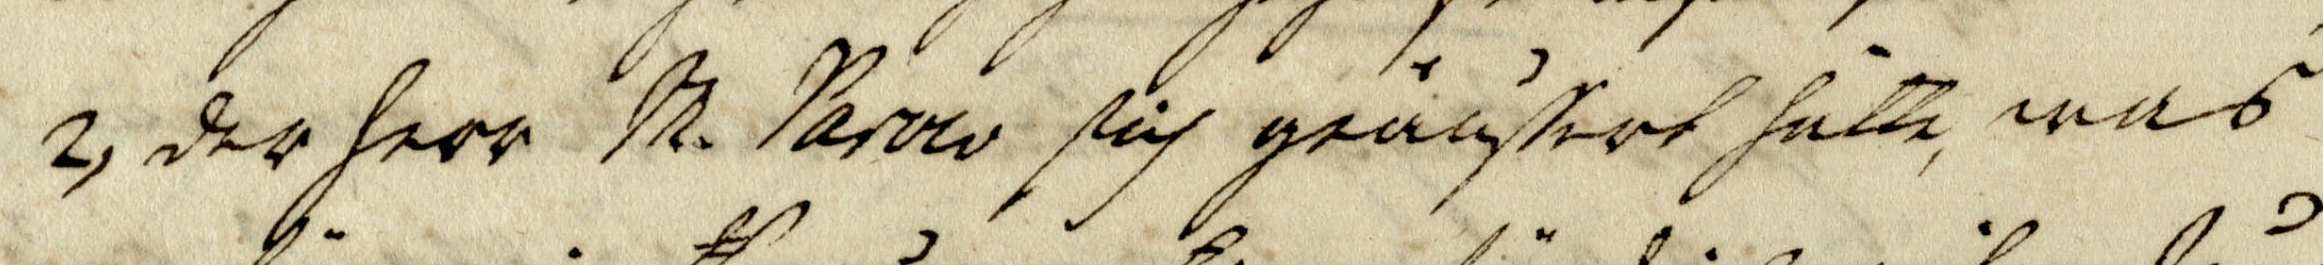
2, der Herr M. Parow sich geäussert hätte, was
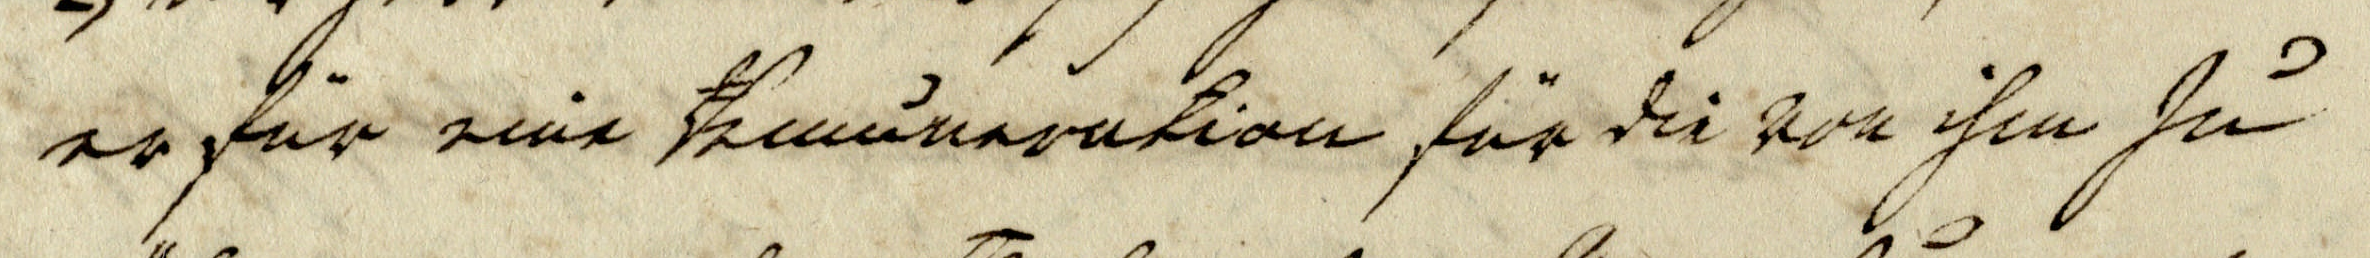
er für eine Remuneration für die von ihm zu
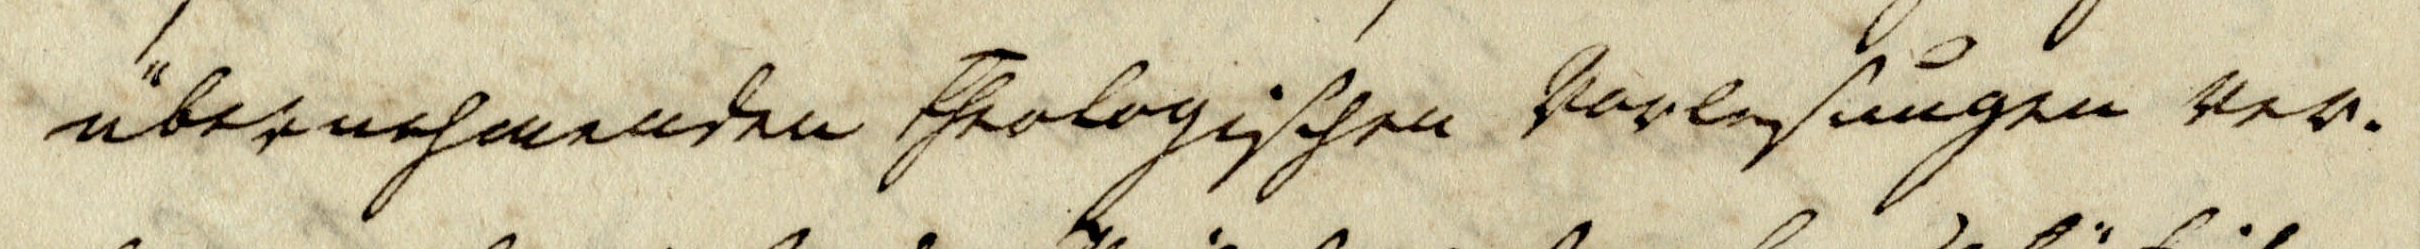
übernehmenden theologischen Vorlesungen ver¬
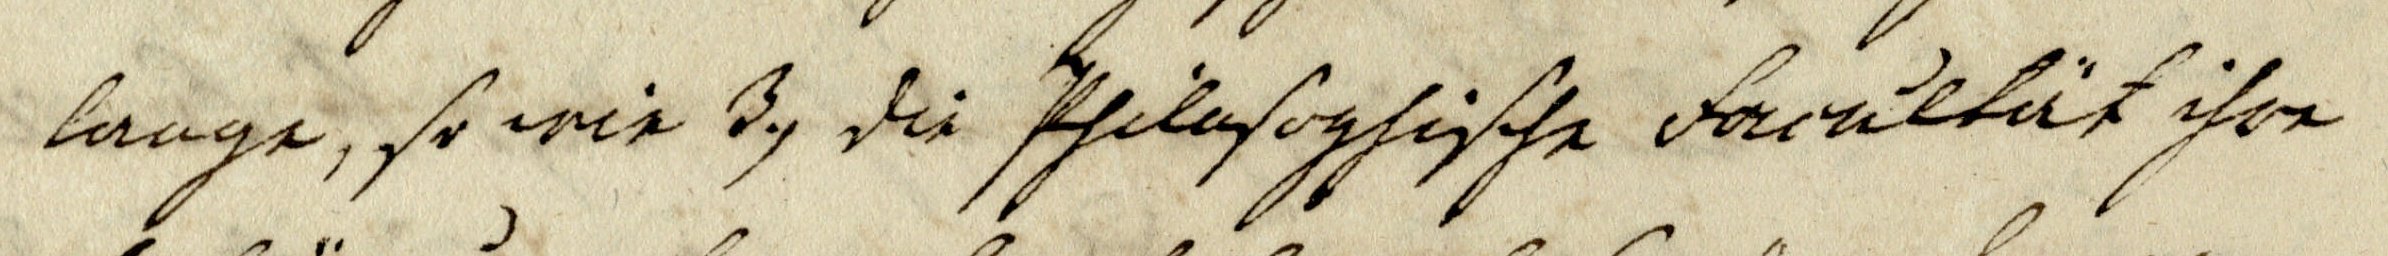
lange, so wie 3., die Philosophische Facultät ihre
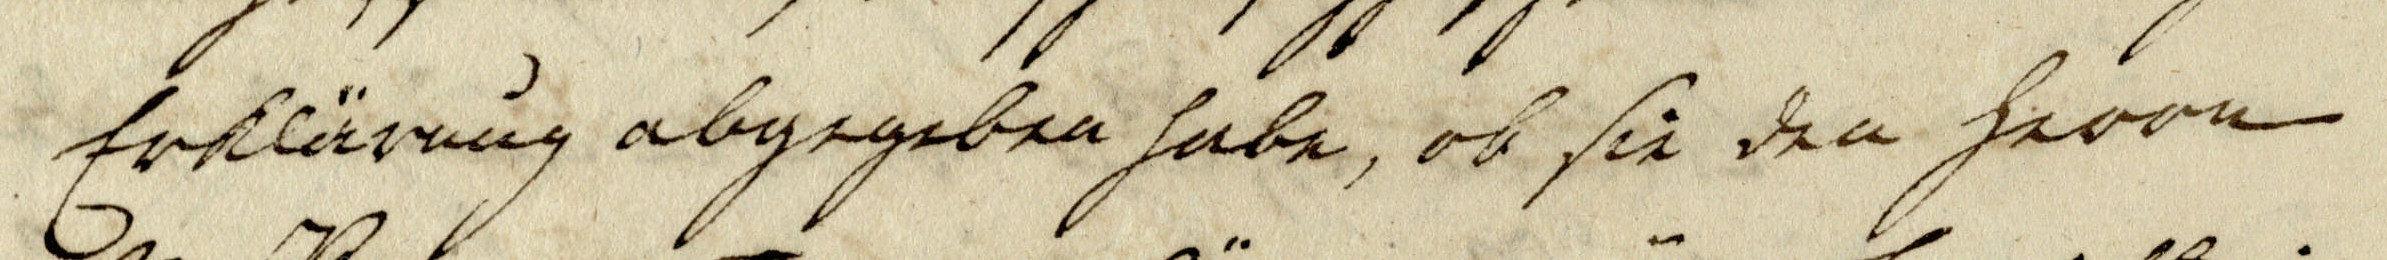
Erklärung abgegeben habe, ob sie den Herrn
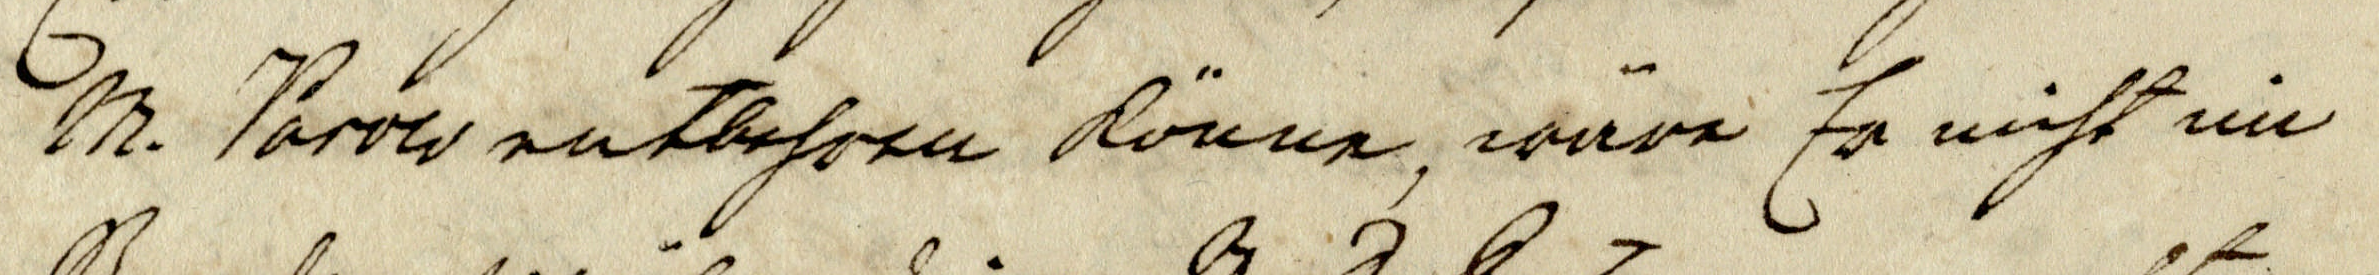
M. Parow entbehren könne, wäre Er nicht im
